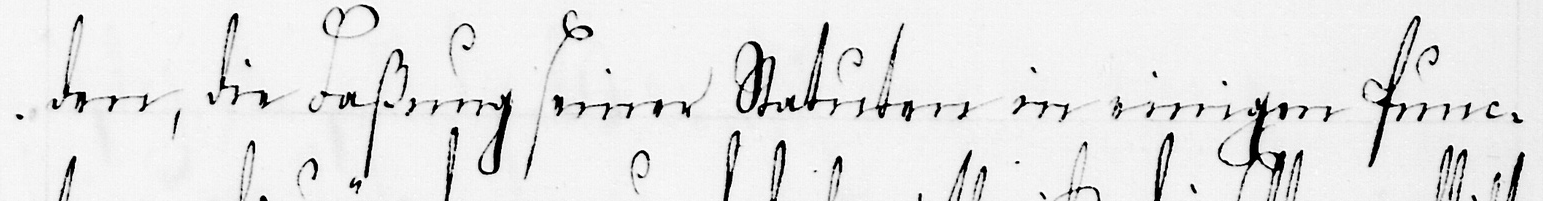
den, die Faßung seiner Statuten in einigen Punc¬
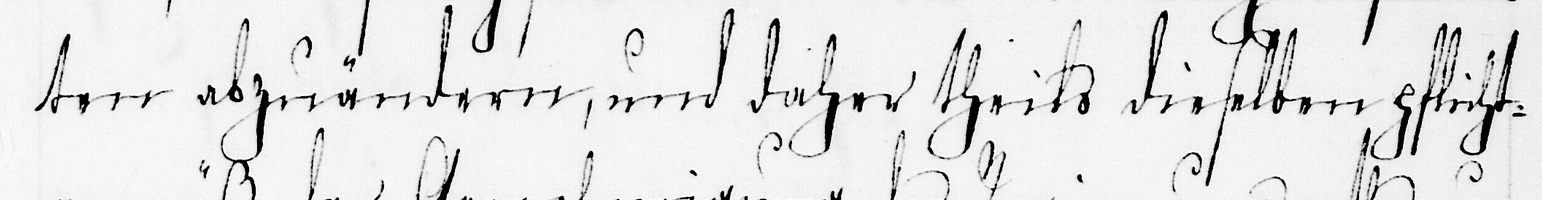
ten abzuändern, und daher theils dieselben pflicht¬
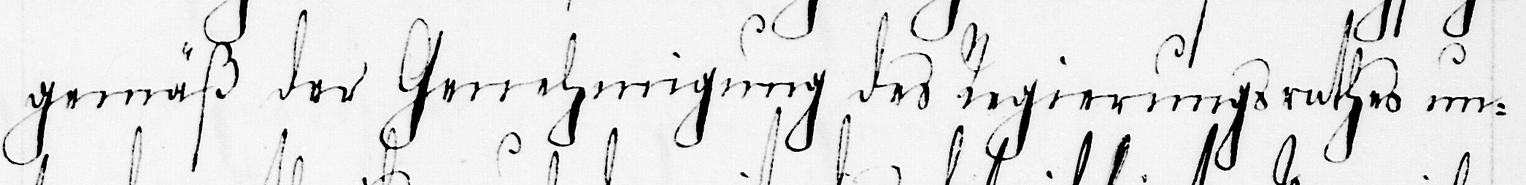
gemäß der Genehmigung des Regierungsrathes un¬
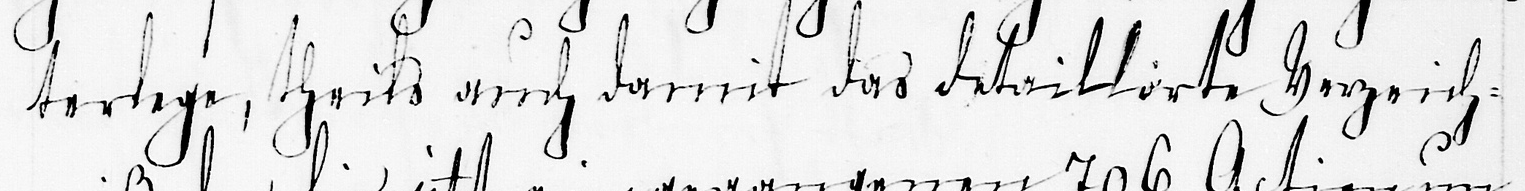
terlege, theils auch damit das detaillirte Verzeich¬
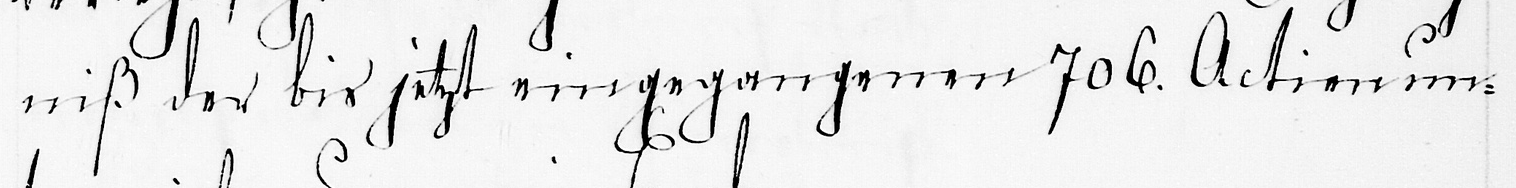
niß der bis jetzt eingegangenen 706. Actienun¬
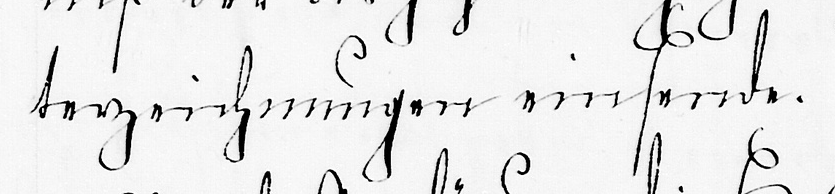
terzeichnungen einsende.
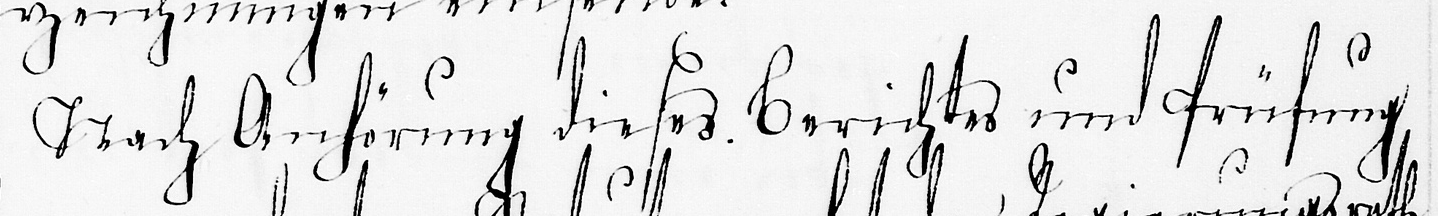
Nach Anhörung dieses Berichtes und Prüfung
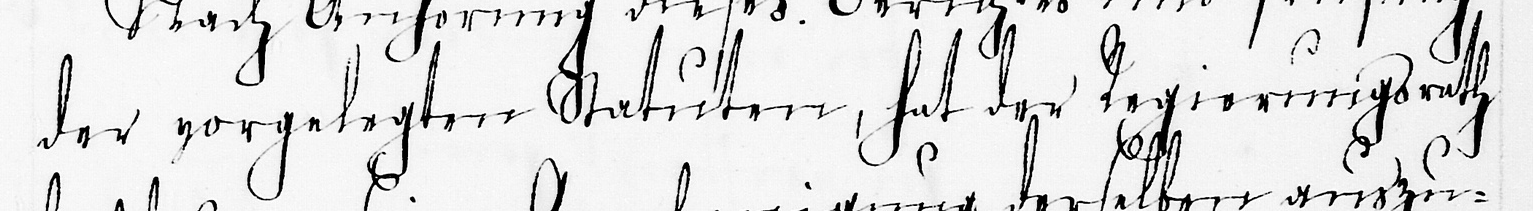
der vorgelegten Statuten, hat der Regierungsrath
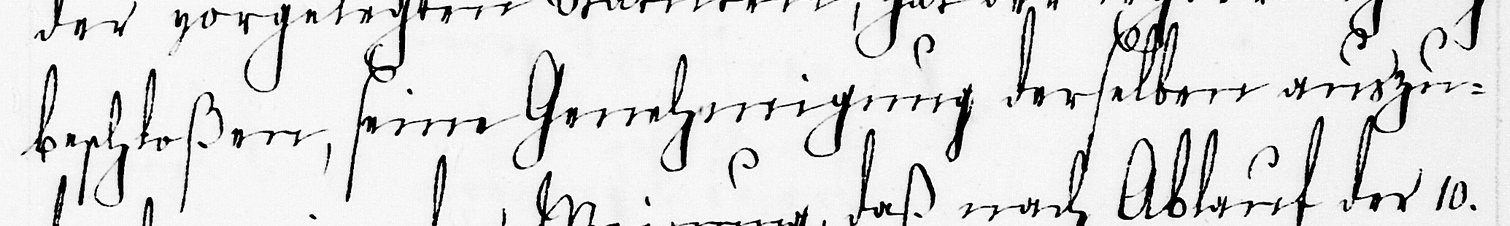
beschloßen, seine Genehmigung derselben auszu¬
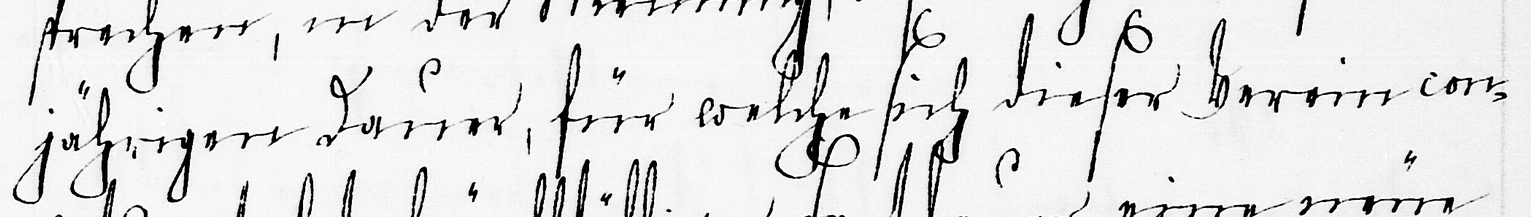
ährigen Dauer, für welche sich dieser Verein con¬
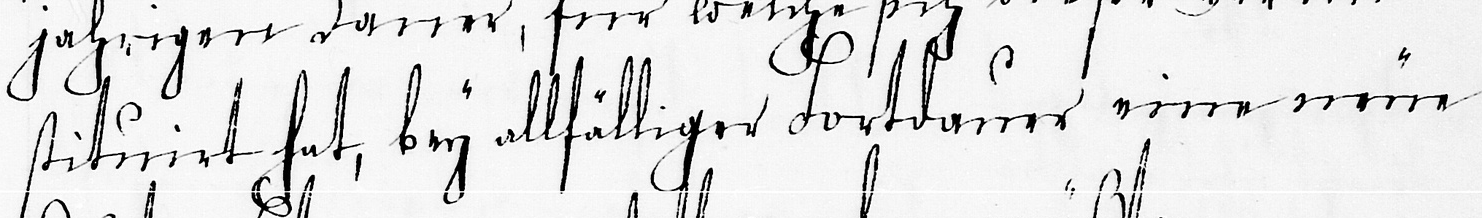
stituirt hat, bey allfälliger Fortdauer eine neue
